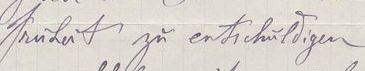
Freiheit zu entschuldigen,
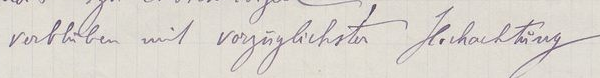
verbleiben mit vorzüglichster Hochachtung
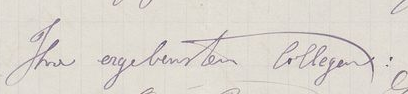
Ihre ergebensten Collegen:
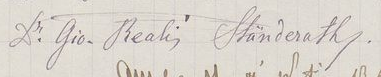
Dr Gio. Reali Ständerath.
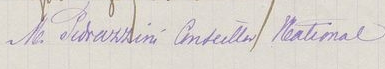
M. Pedrazzini Conseiller National
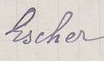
Herrn
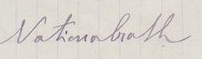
Nationalrath
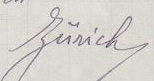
Zürich.
